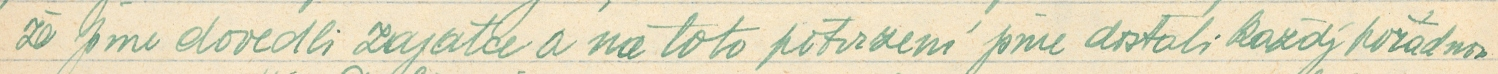že jsme dovedli zajatce a na toto potvrzení jsme dostali každý pořádnou
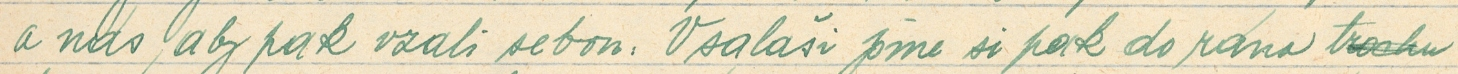a nás, aby pak vzali sebou. V salaši jsme si pak do rána trochu
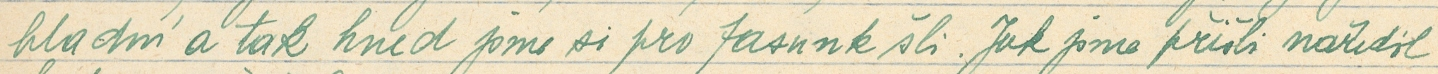hladní a tak hned jsme si pro fasunk šli. Jak jsme přišli nařídil
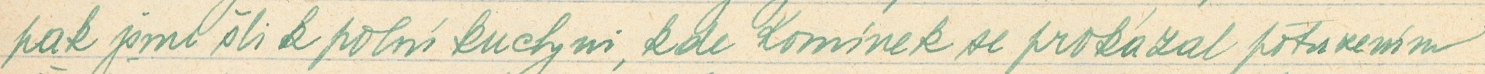pak jsme šli k polní kuchyni, kde Komínek se prokázal potvrzením
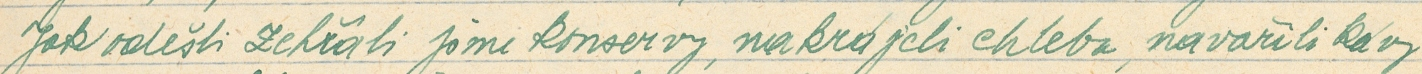Jak odešli zehřáli jsme konservy, nakrájeli chleba, navařili kávy
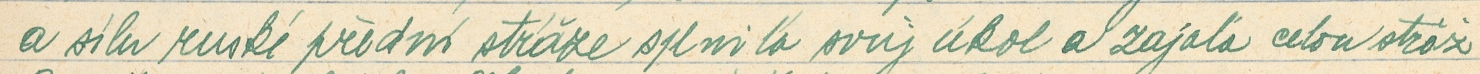a sílu ruské přední stráže splnila svůj úkol a zajala celou stráž
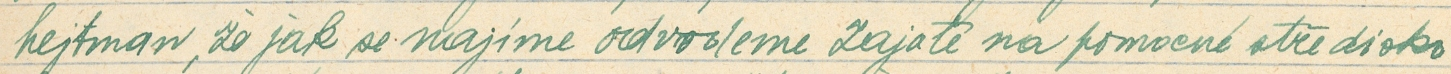hejtman, že jak se najíme odvedeme zajaté na pomocné středisko
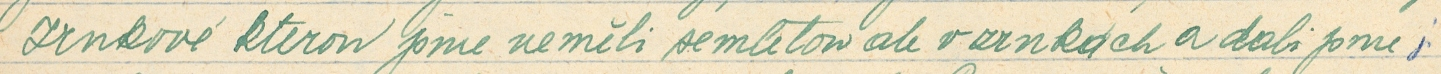zrnkové kterou jsme neměli semletou ale v zrnkách a dali jsme ji
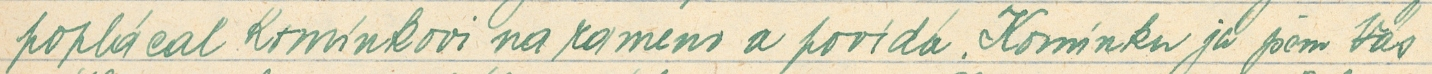poplácal Komínkovi na rameno a povídá. Komínku ja jsem Vás
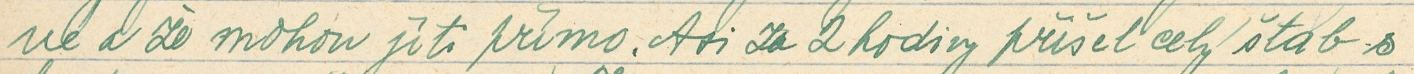né a že mohou jíti přímo. Asi za 2 hodiny přišel celý štáb s
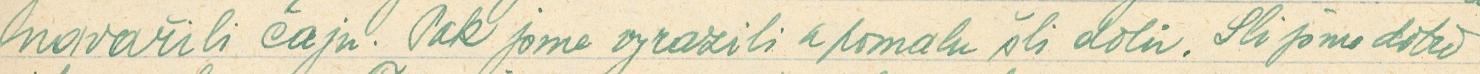navařili čaju. Pak jsme vyrazili a pomalu šli dolů. Šli jsme dobře
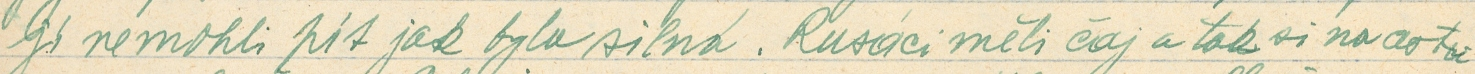jí nemohli pít jak byla silná. Rusáci měli čaj a tak si na cestu
